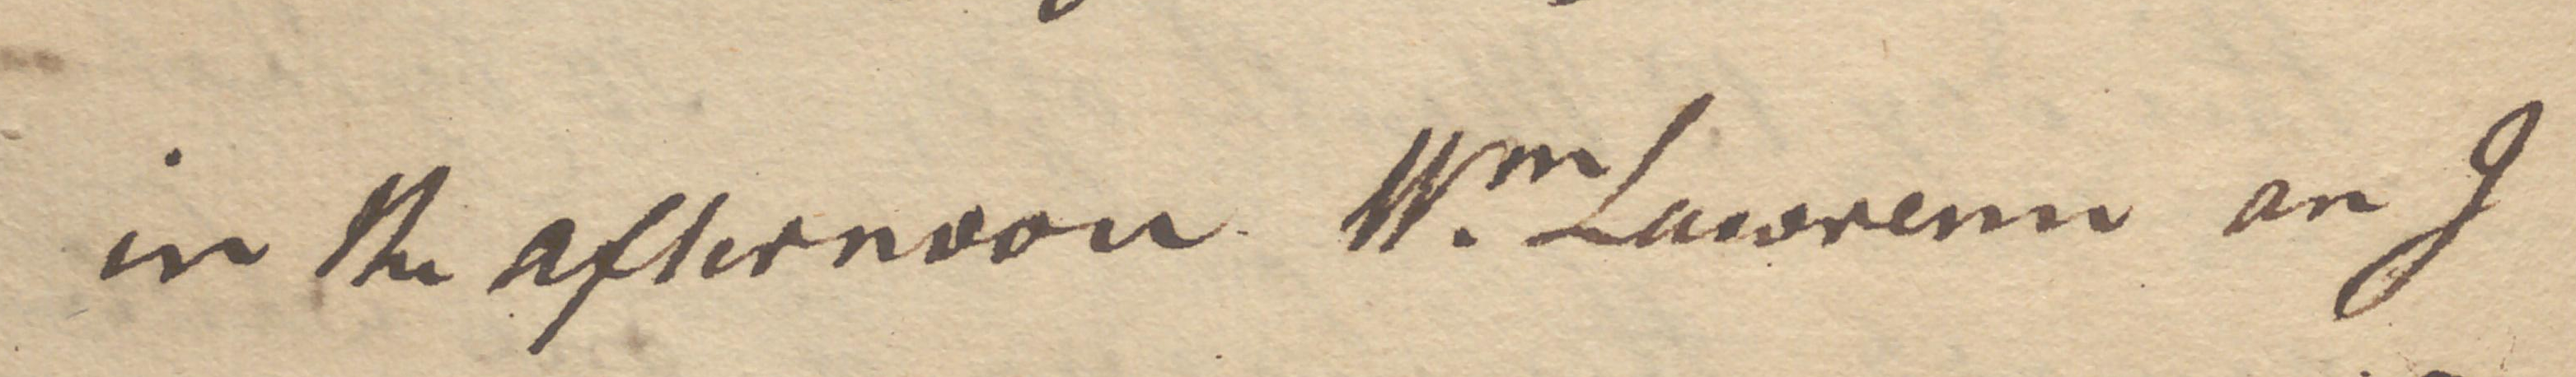in the afternoon. W^m. Lawrence an I
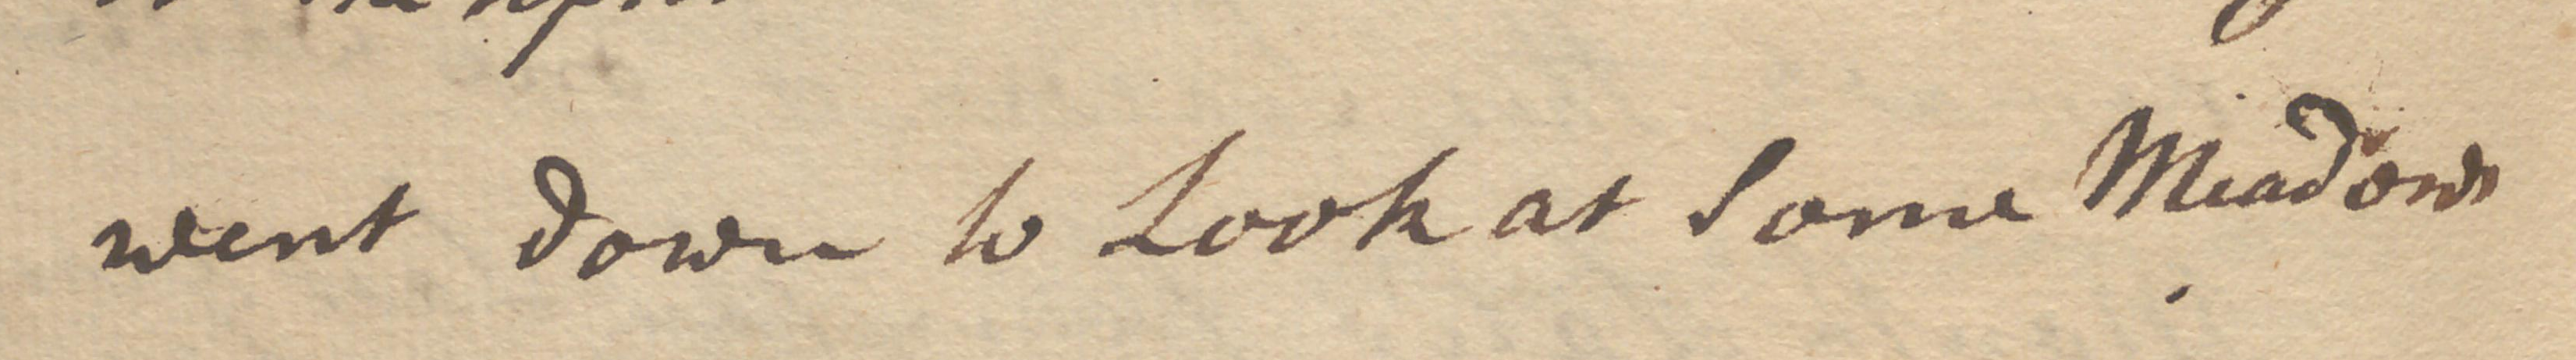went down to Look at some Meadows
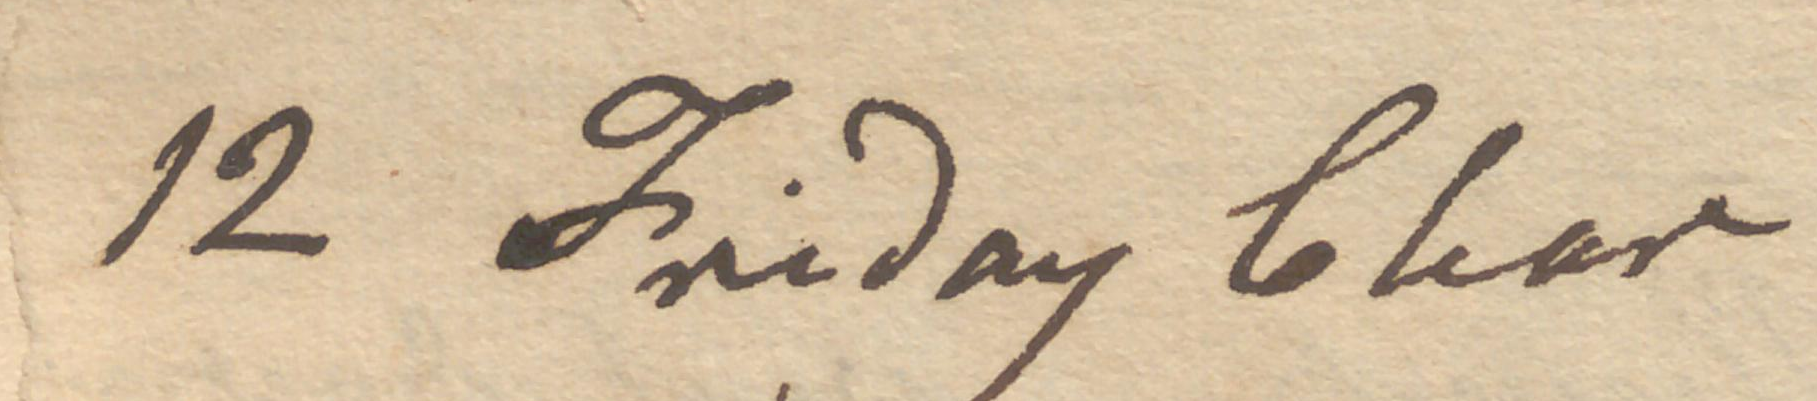12 Friday Clear
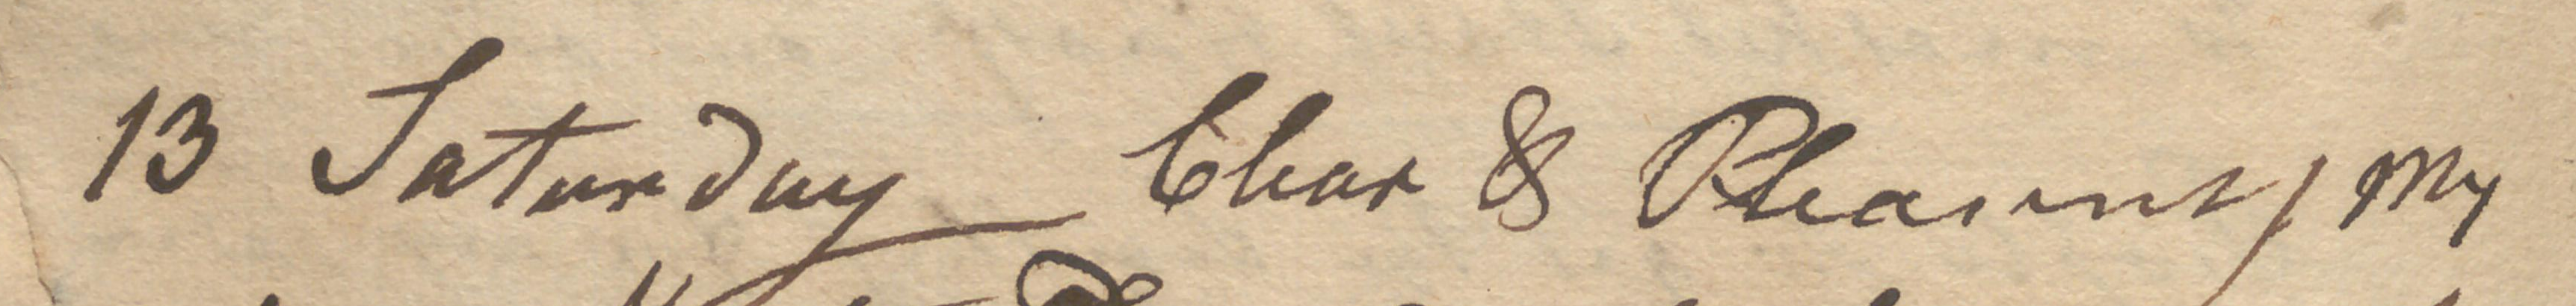13 Saturday Clear & Pleasant), My
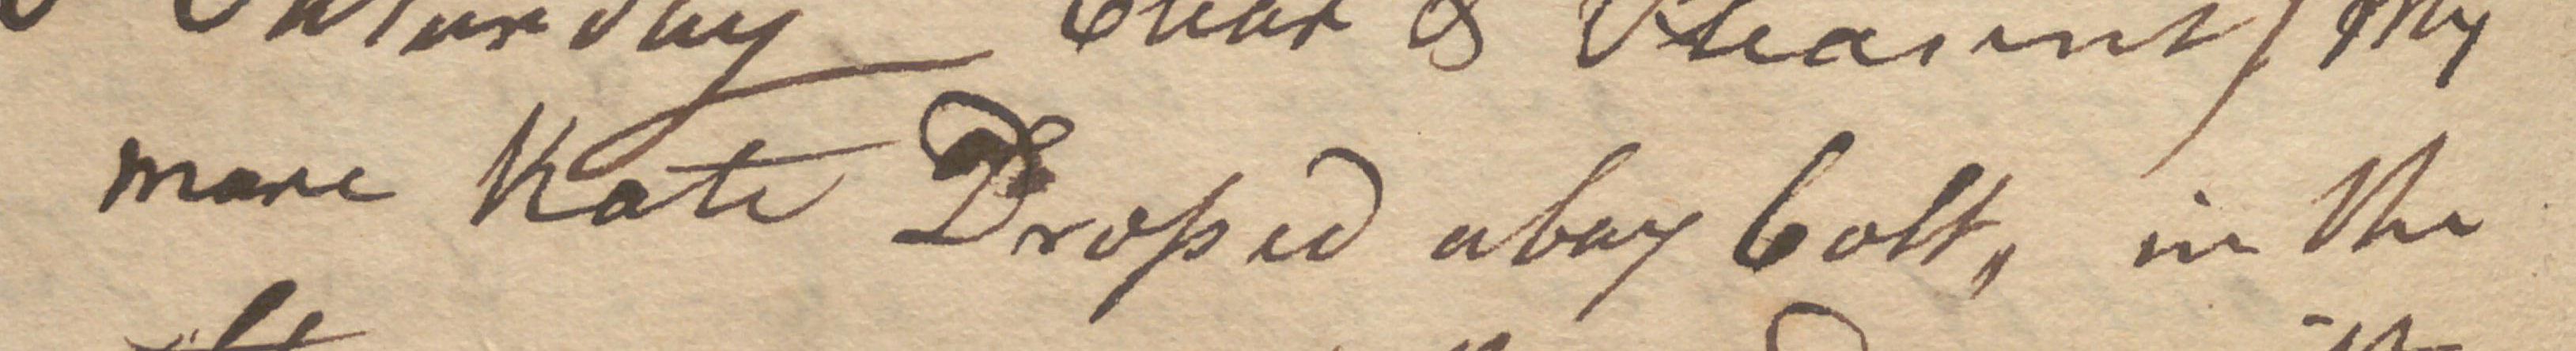mare Kate Droped a bay Colt, in the
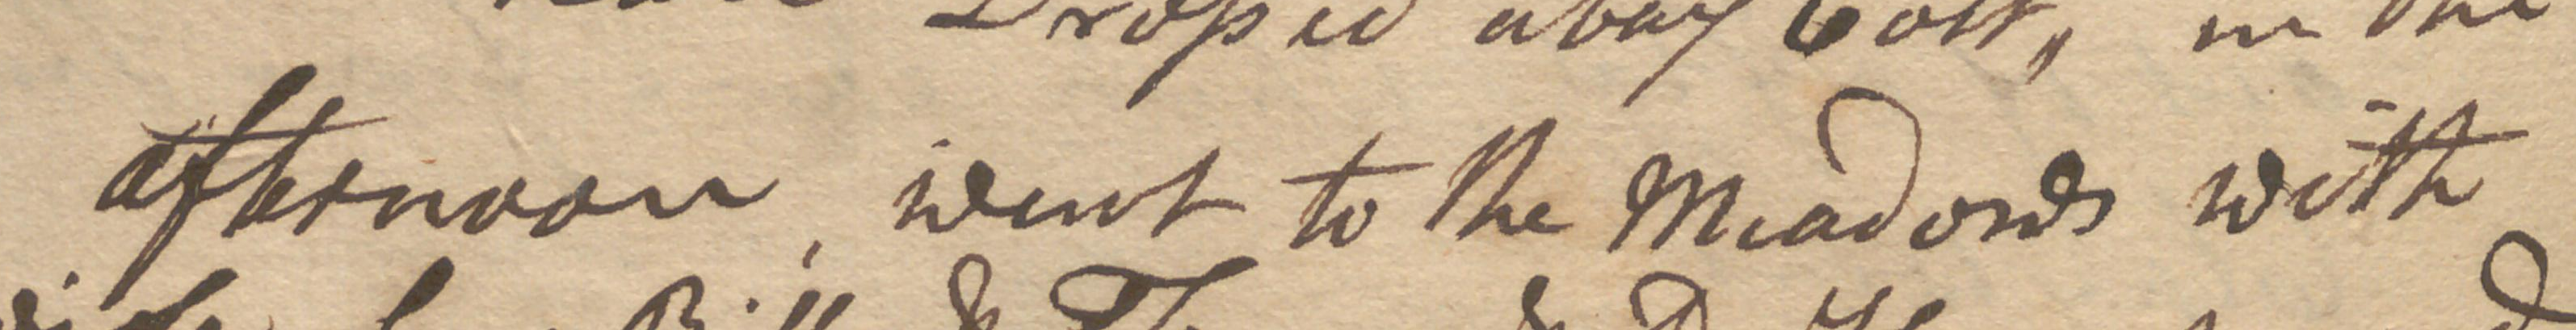afternoon went to the Meadows with
